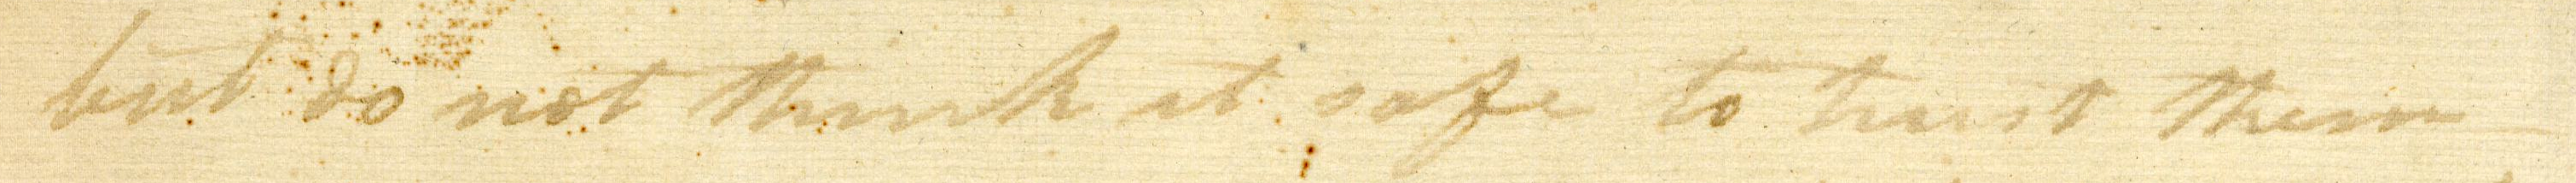but do not think it safe to trust them
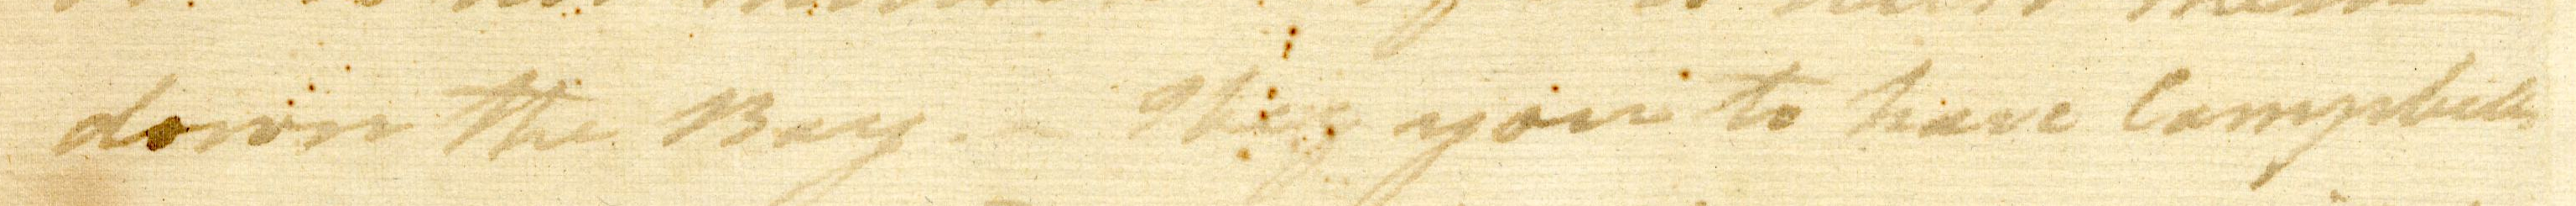down the Bay. I beg you to have Campbells
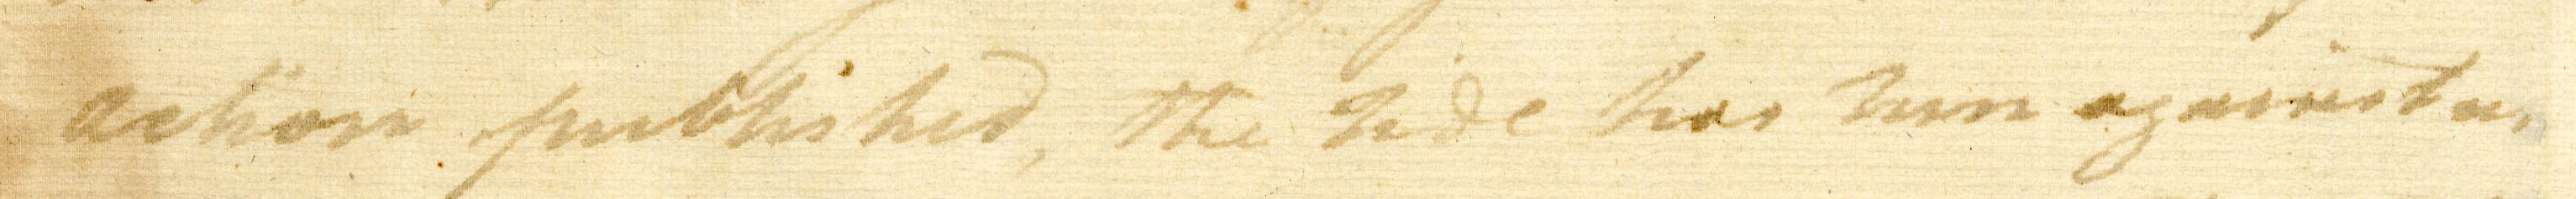action published, the Tide has run against us
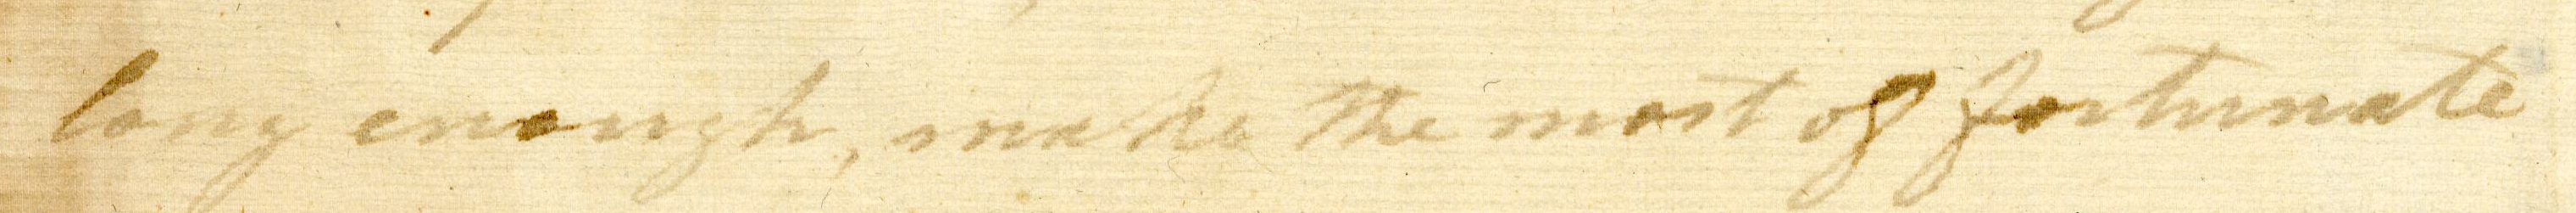long enough, make the most of fortunate
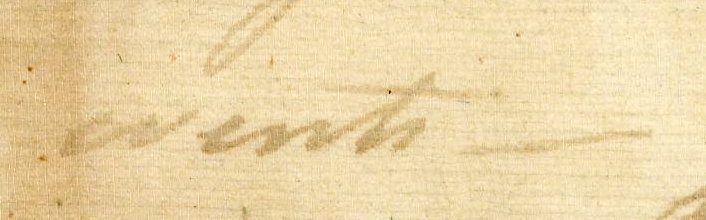events-
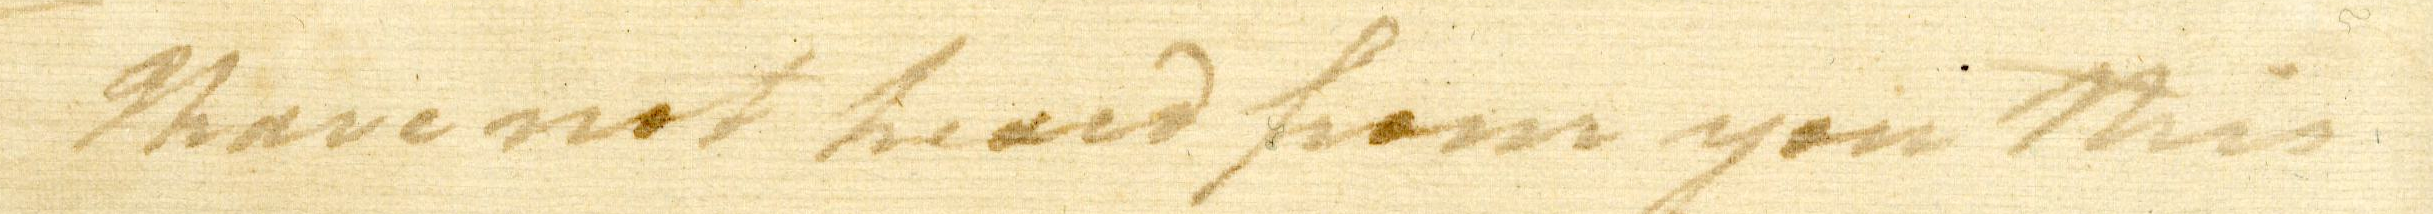I have not heard from you this
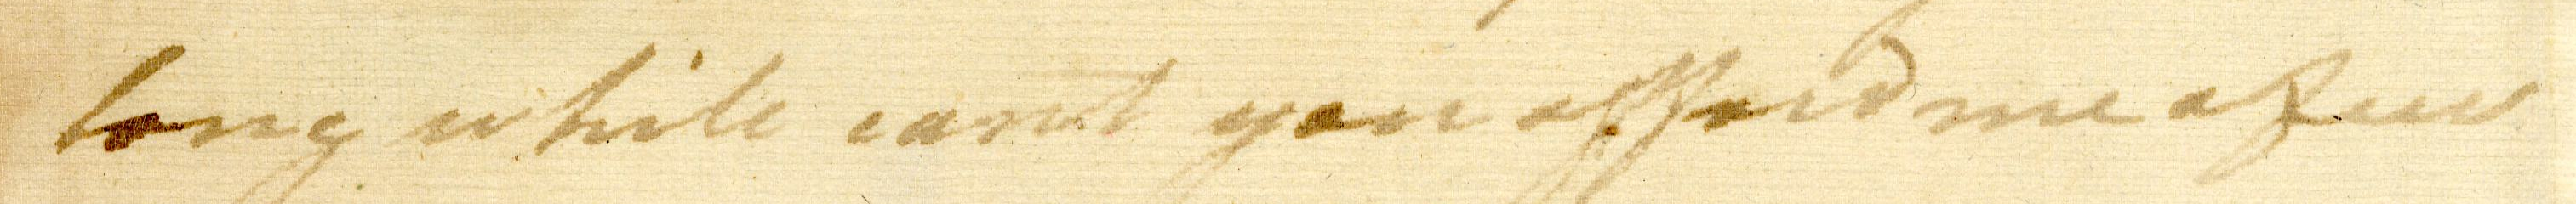long while cant you afford me a few
